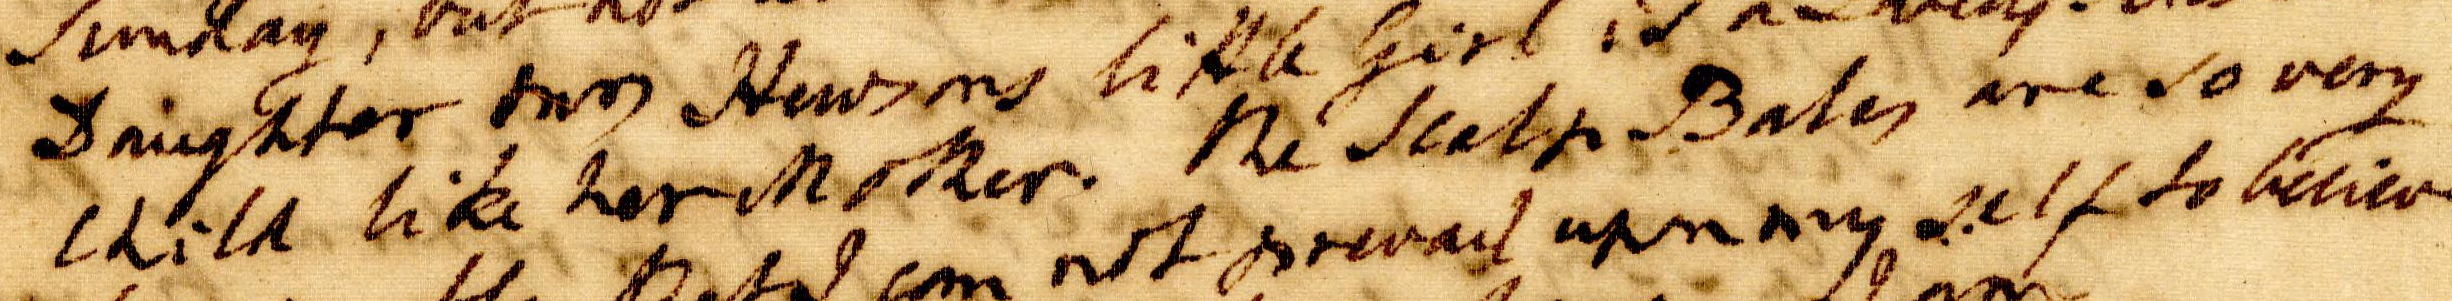Child like her Mother. The Scalp Bales are so very
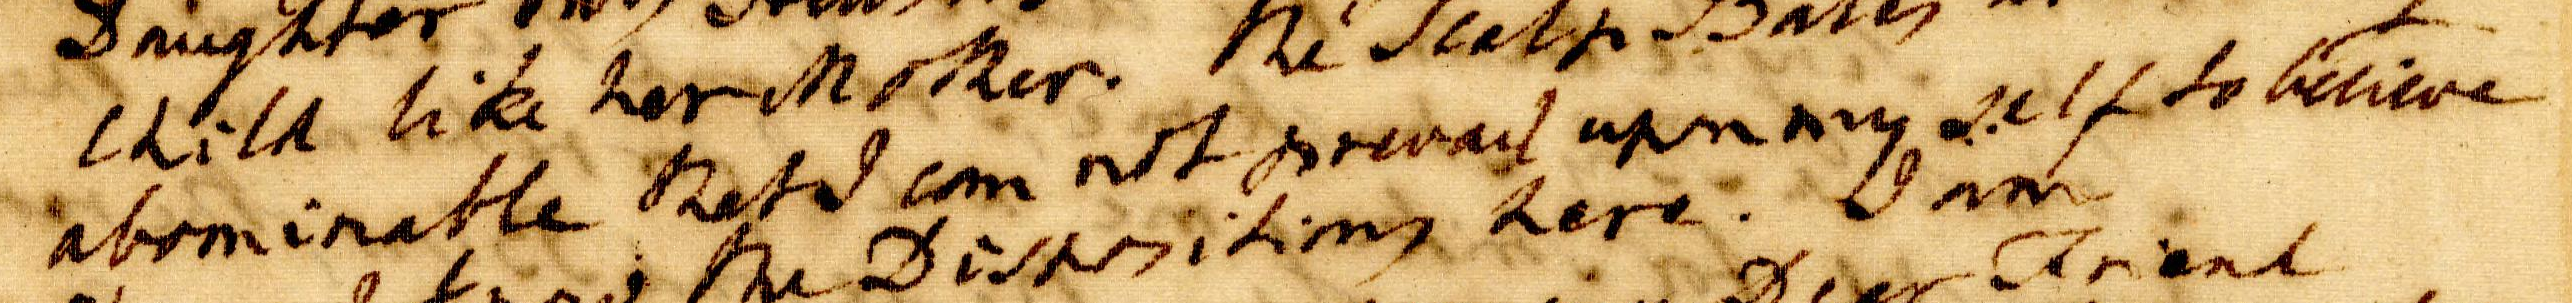abominable that I can not prevail upon my self to believe
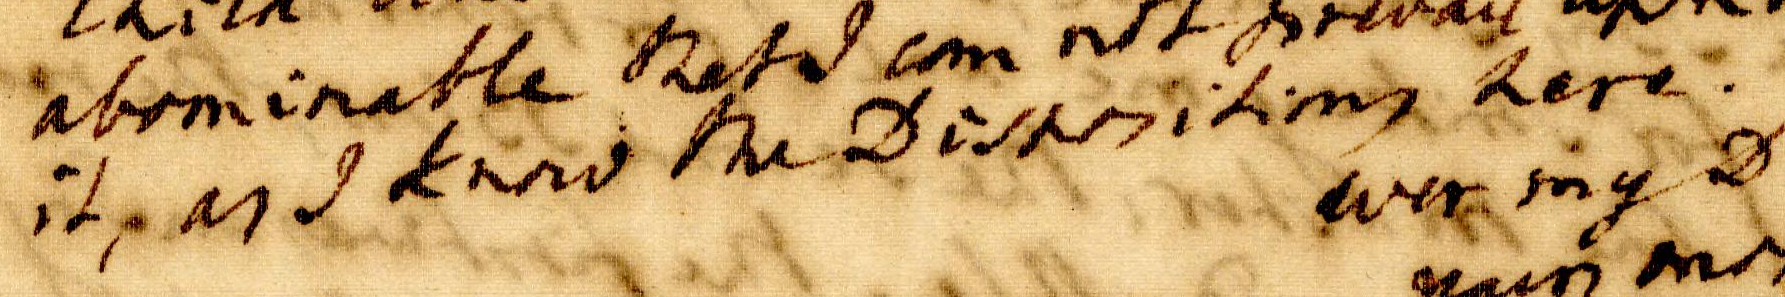it, as I know the Dispositions here.
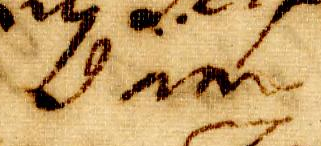I am
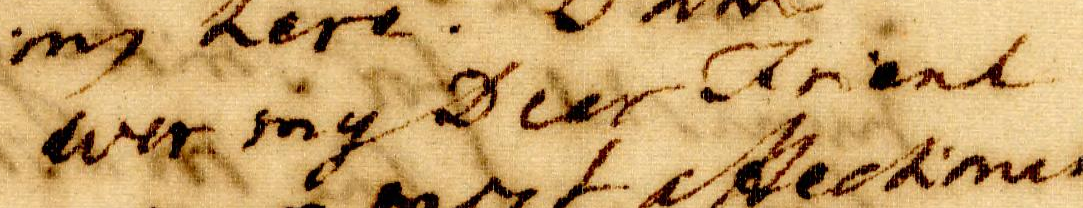ever my Dear Friend
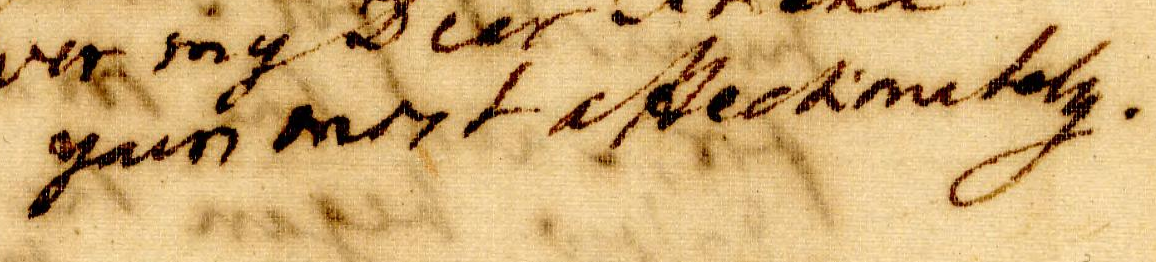yours most affectionately.
